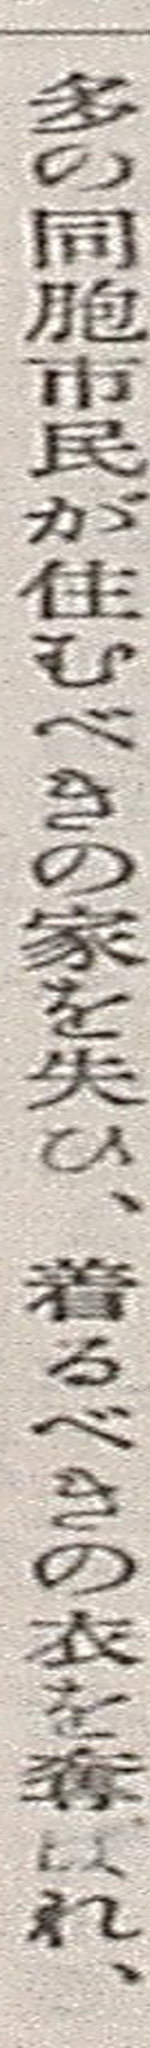多の同朋市民が住むべきの家を失ひ、着るべきの衣を奪はれ、
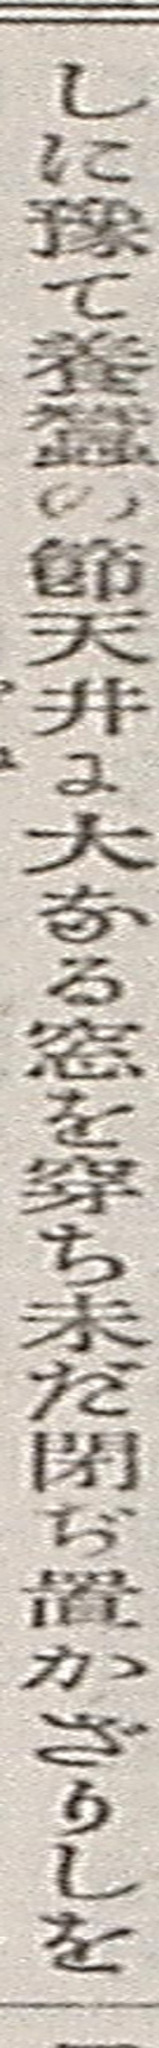しに豫て養蚕の節天井に大なる窓を穿ち未だ閉ぢ置かざりしを
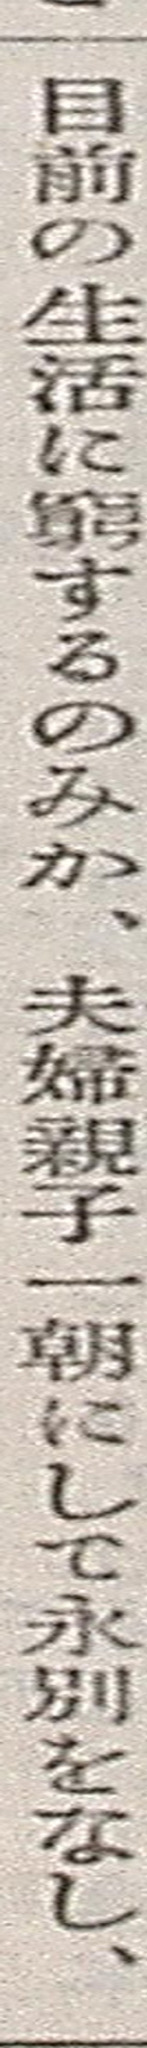目前の生活に窮するのみか、夫婦親子一朝にして永別をなし、
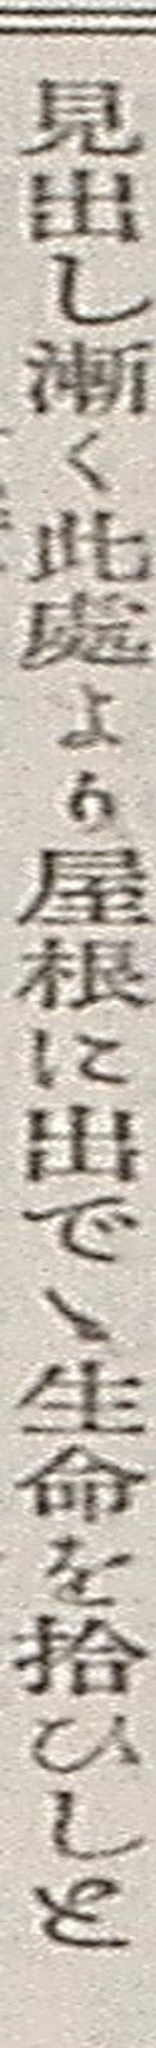見出し漸く此処より屋根に出でゝ生命を拾ひしと
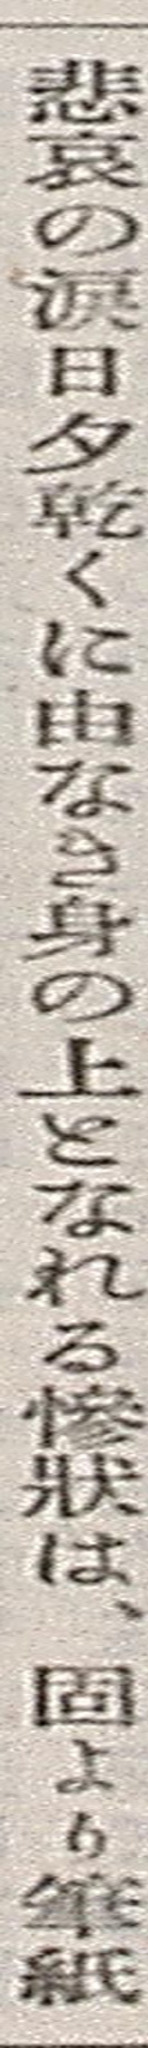悲哀の涙日夕乾くに由なき身の上となれる惨状は、固より筆紙
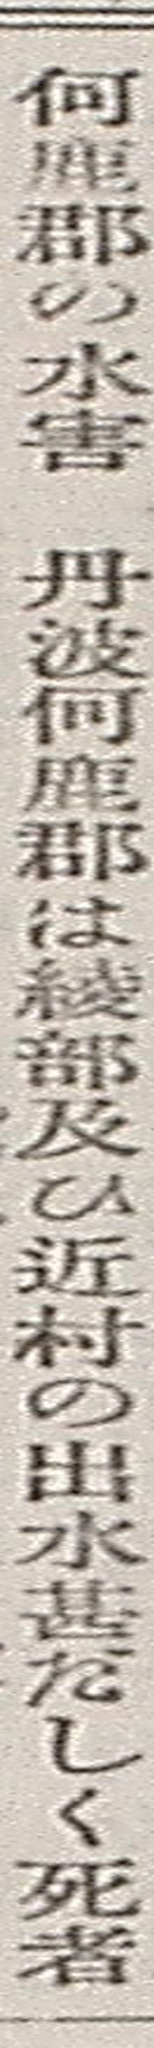何鹿郡の水害丹波何鹿郡は綾部及ひ近村の出水甚だしく死者
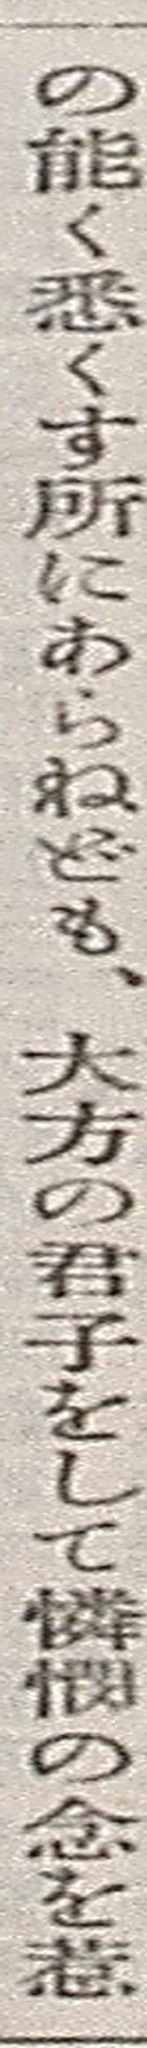の能く悉くす所にあらねども、大方の君子をして憐憫の念を惹
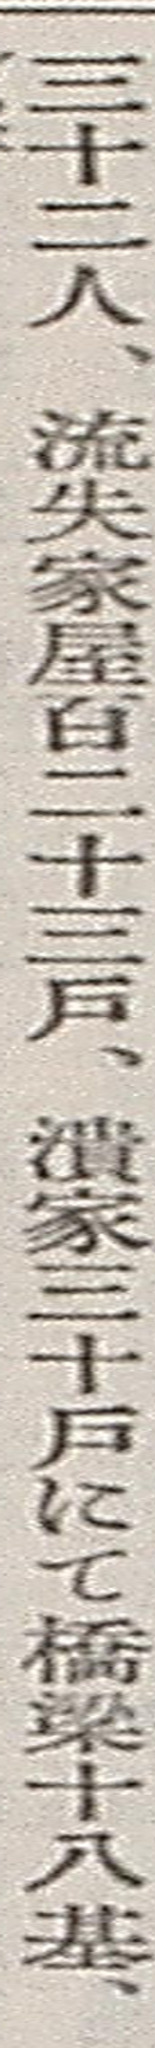三十二人、流失家屋百二十三戸、潰家三十戸にて橋梁十八基、
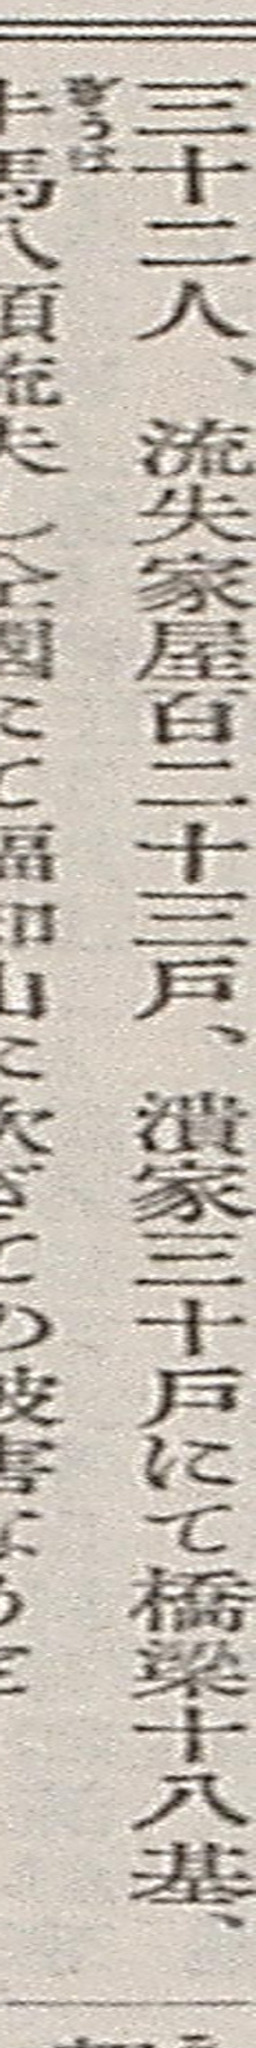牛馬八頭流失し全国にて福知山に次ぎての被害なりと
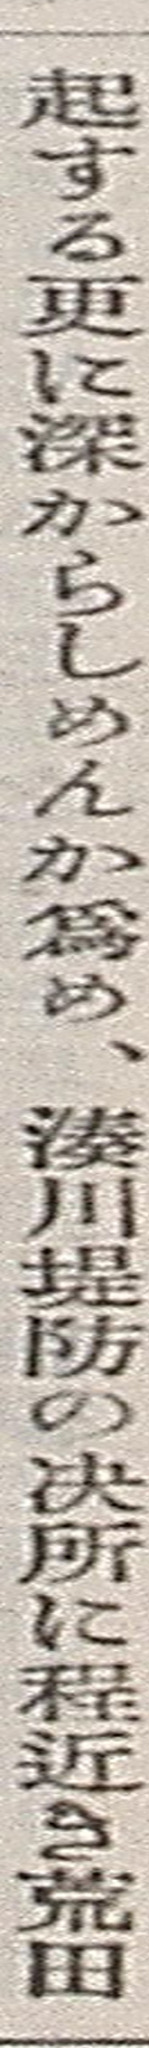起する更に深からしめんか為め、湊川堤防の决所に程近き荒田
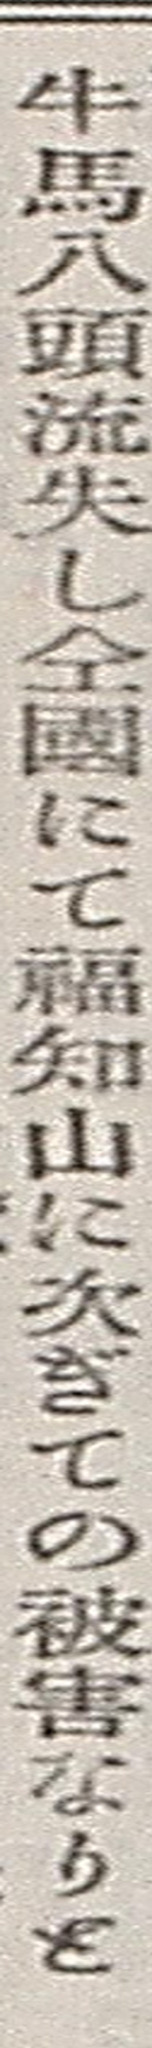牛馬八頭流失し全国にて福知山に次ぎての被害なりと
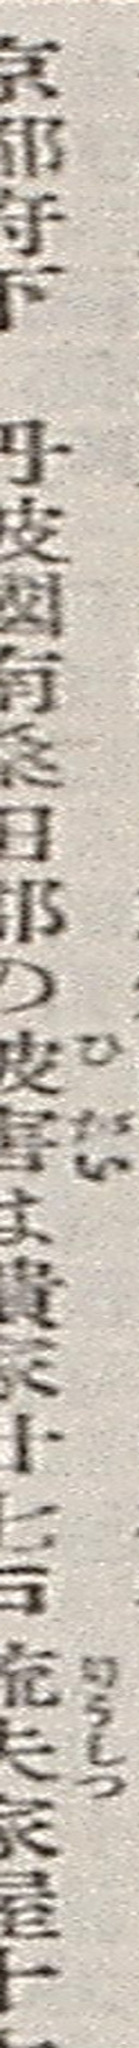京都府下丹波国南桑田郡の被害は潰家廿七戸流失家屋十六戸
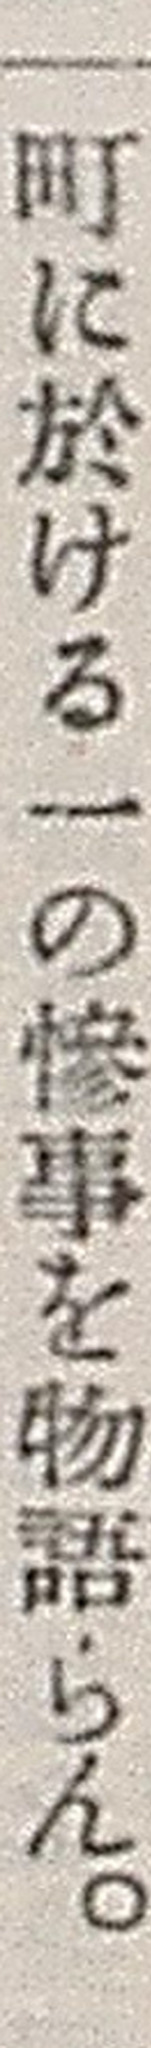町に於ける一の惨事を物語らん
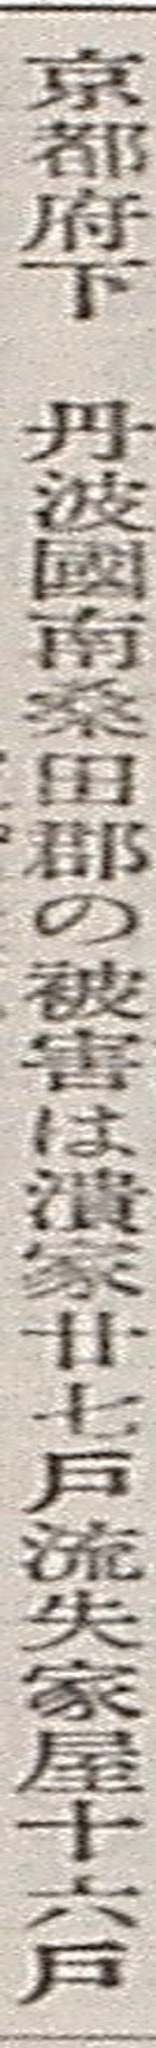京都府下丹波国南桑田郡の被害は潰家廿七戸流失家屋十六戸
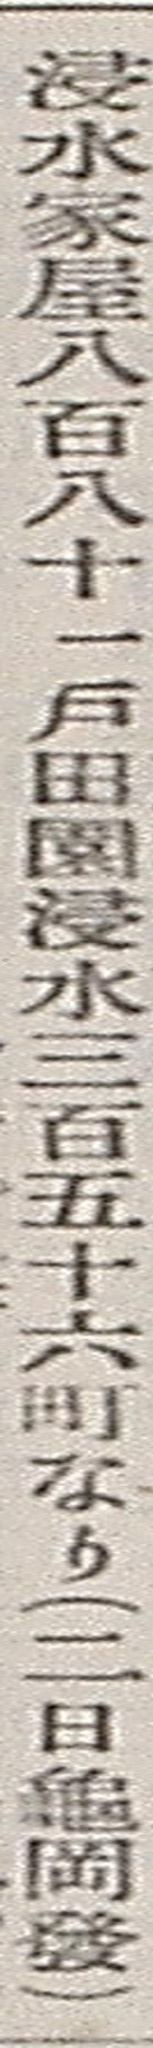浸水家屋八百八十一戸田園浸水三百五十六町なり
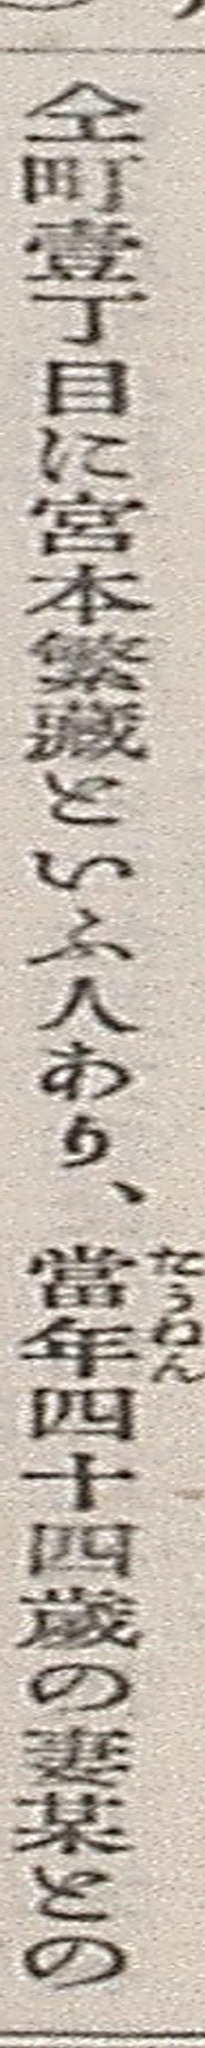同町一丁目に宮本繁蔵といふ人あり、当年四十四歳の妻某との
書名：風俗畫報臨時増刊第百二十六號　洪水被害録（中）
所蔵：東京大学地震研究所図書室 Earthquake Research Institute Library, The University of Tokyo, JAPAN
